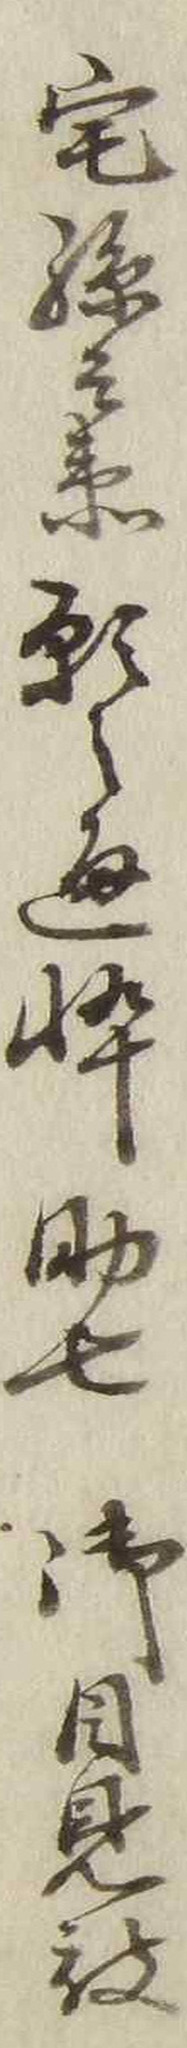宅孫兵衛願之通忰助七御目見被

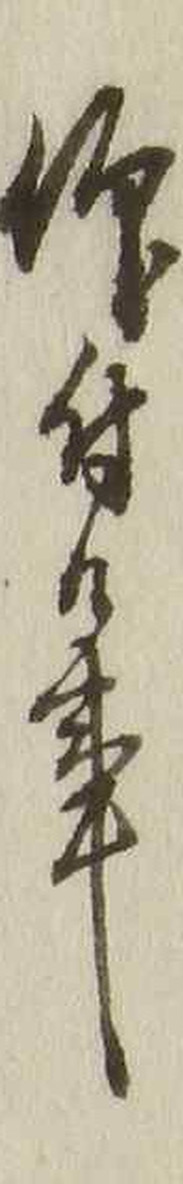仰付候事
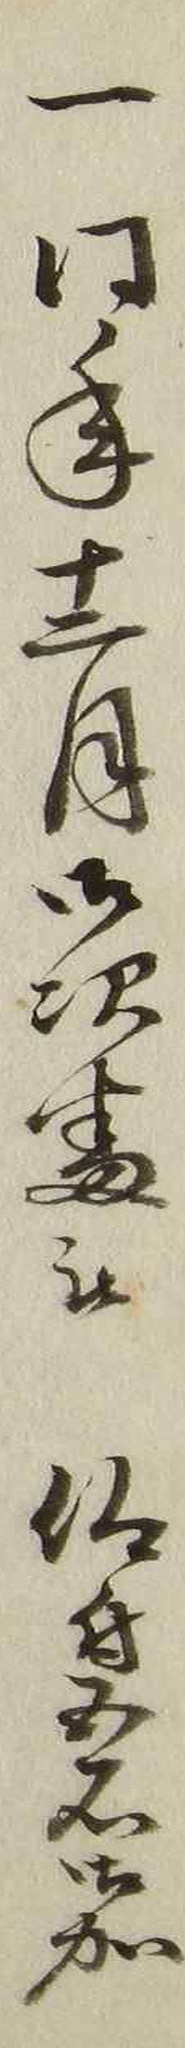一同年十二月御次番被仰付五石御加
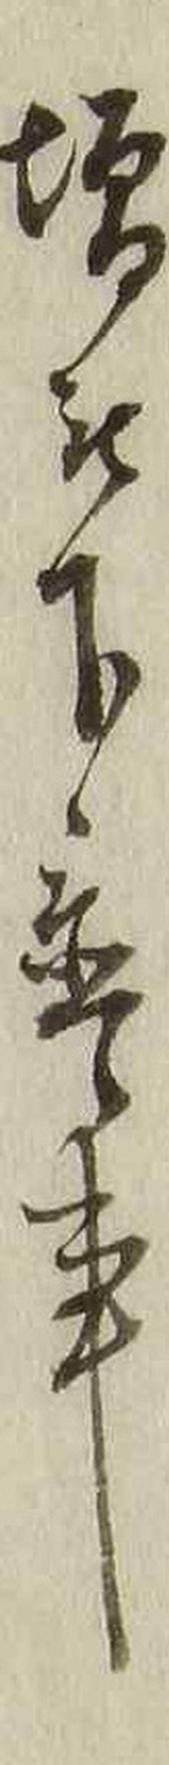増被下置候事
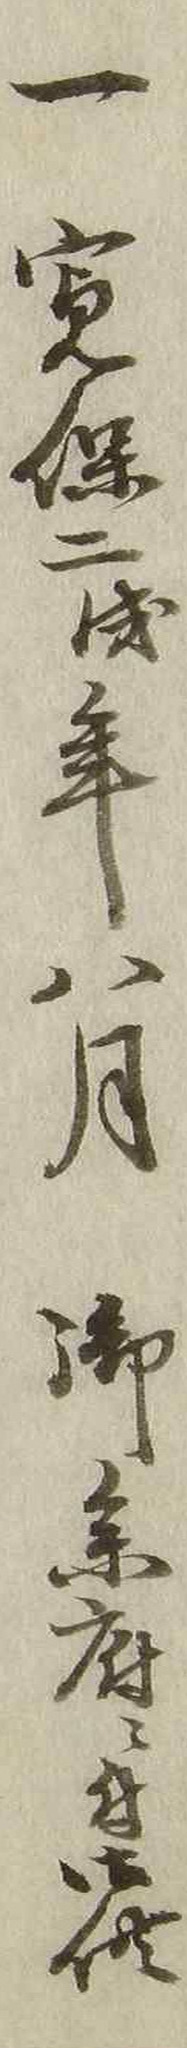一寛保二戌年八月御参府ニ付御供
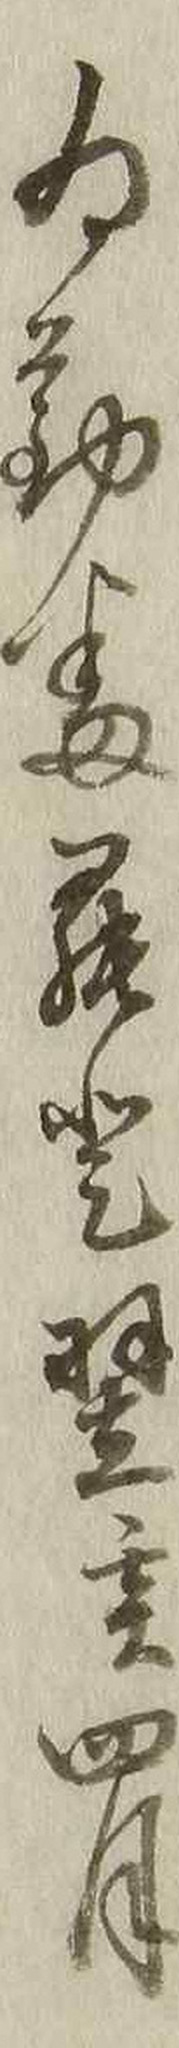為勤番罷登翌亥四月
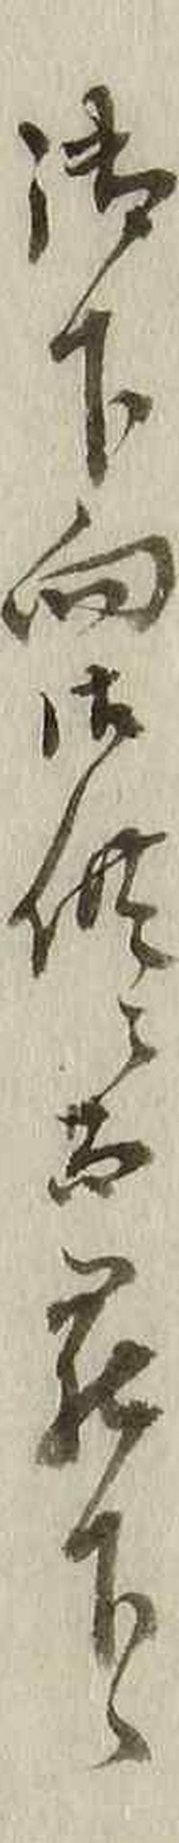御下向御供ニ而罷下候
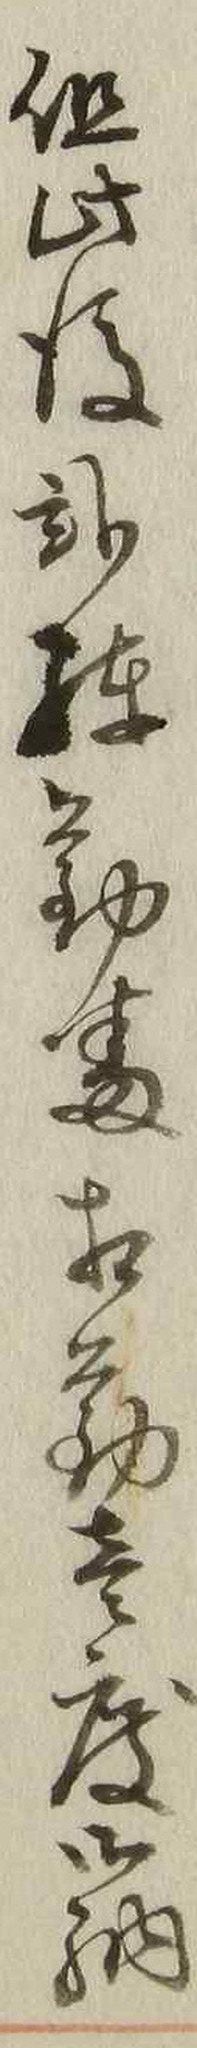但此後弐陣勤番相勤壱度御納
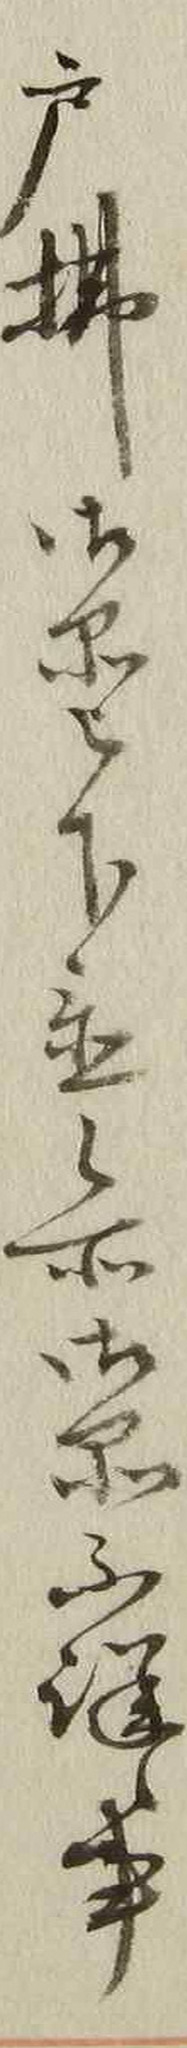戸払御品被下置之所御品不詳候事
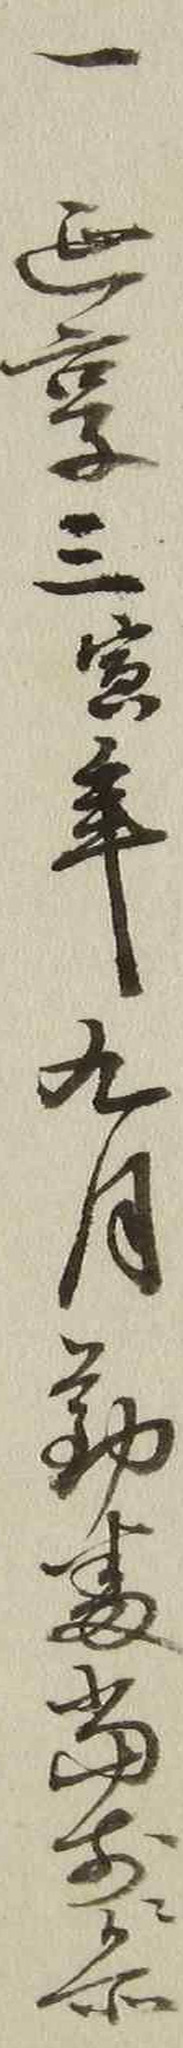一延享三寅年九月勤番当前ニ候所
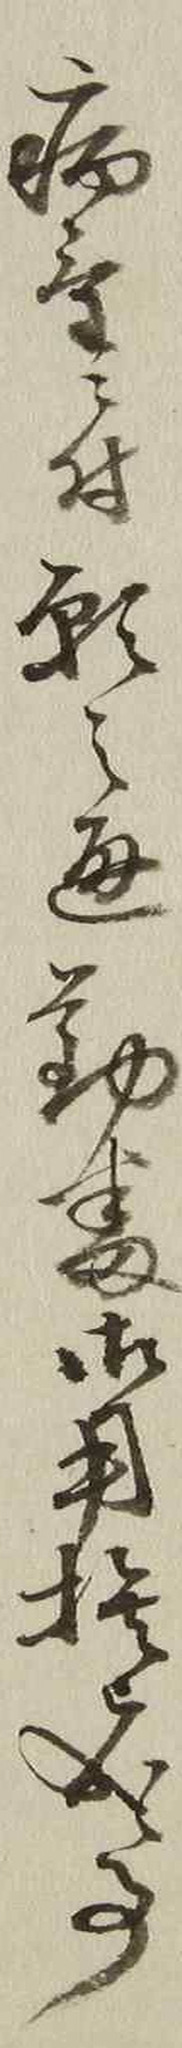病気ニ付願之通勤番御用捨被成候事
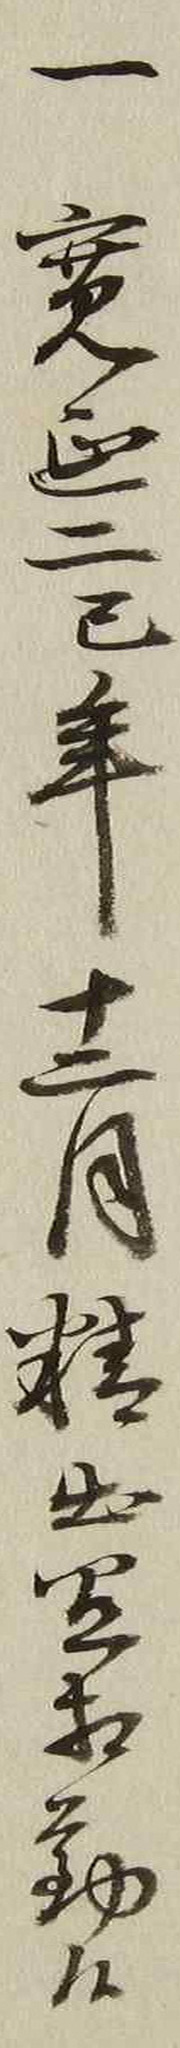一寛延二巳年十二月精出宜相勤候
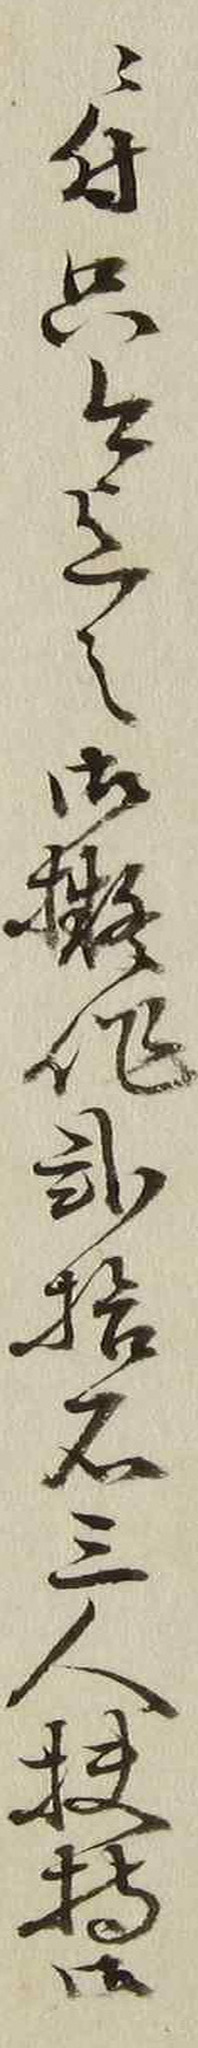ニ付只今迄之御擬作弐拾石三人扶持御
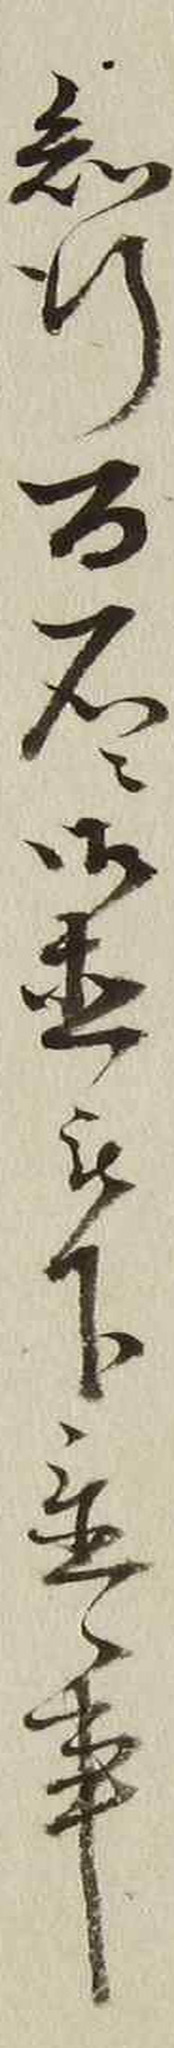知行百石ニ御直被下置候事
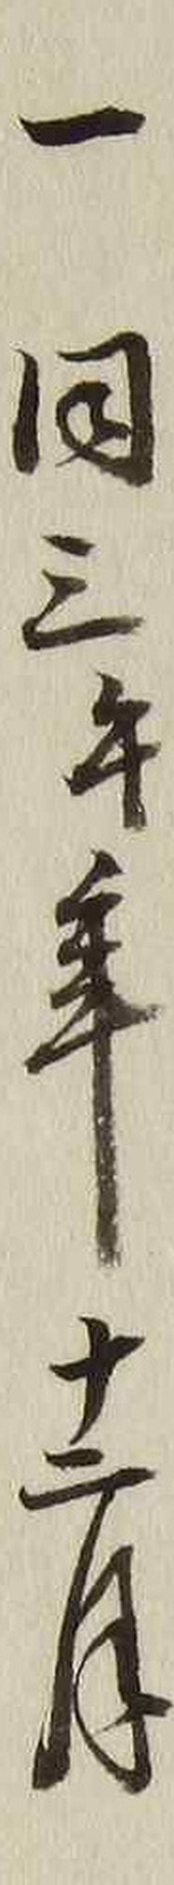一同三午年十二月
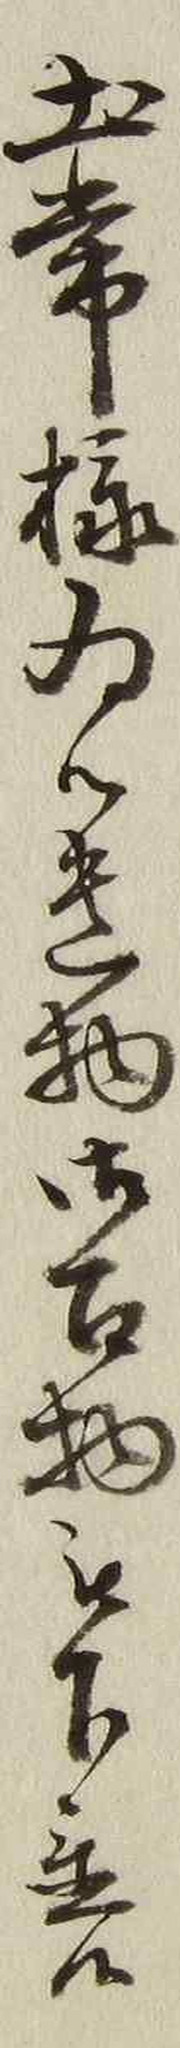土常様為御遺物御召物被下置候
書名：諸士系譜　巻之27　い之部27
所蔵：会津若松市立会津図書館
